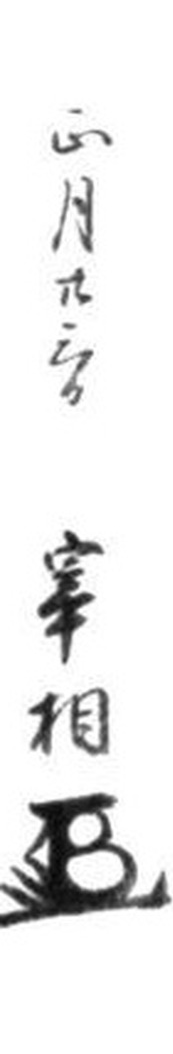正月廿三日宰相花押
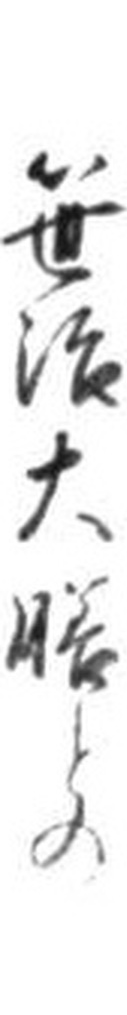笹治大膳との
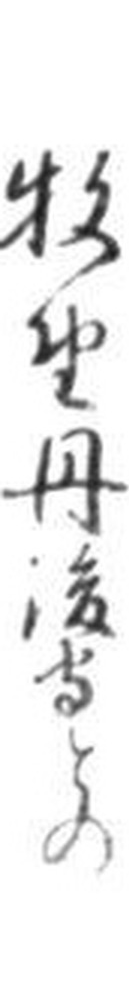牧野丹後守との
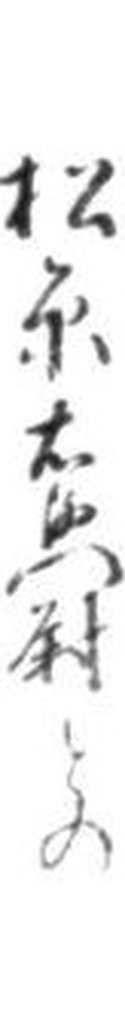松原右衛門尉との
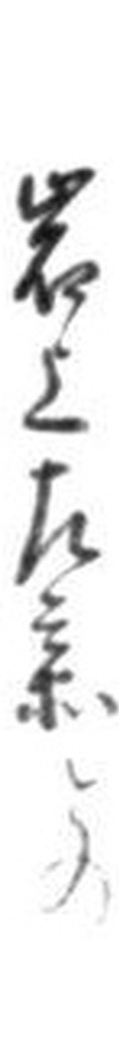岩上左兵衛との
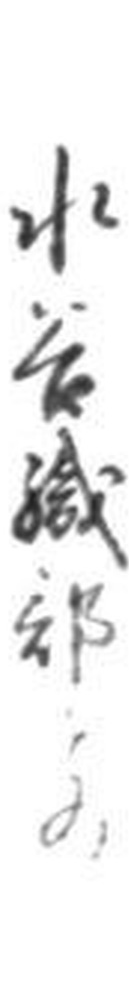水谷織部との
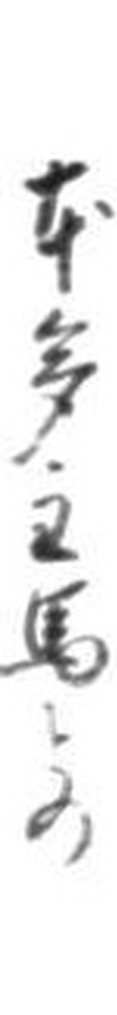本多主馬との
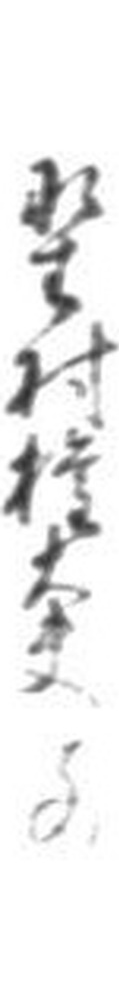野村権太夫との
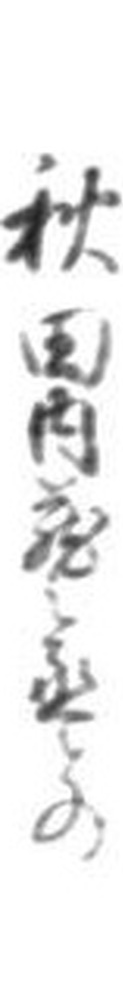秋田内蔵之丞との
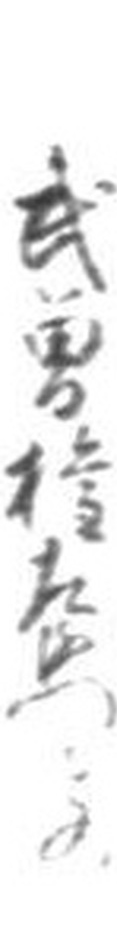武曽権左衛門との
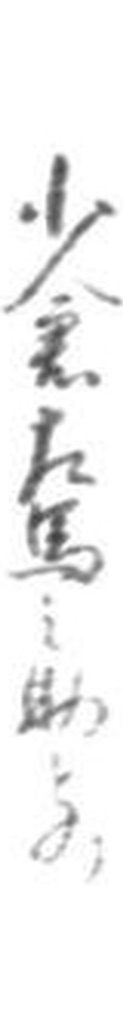小倉左馬之助との
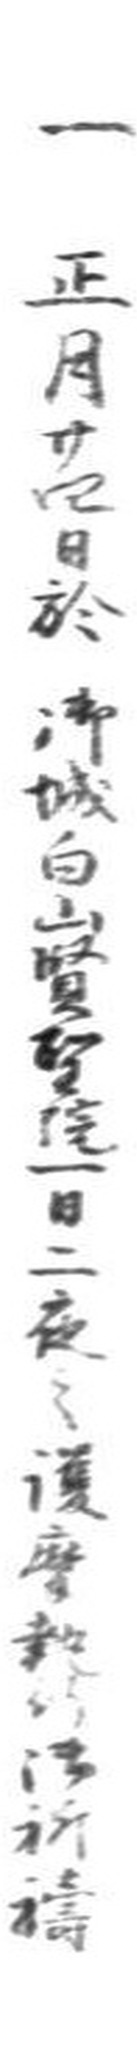一正月廿四日於御城白山賢聖院一日二夜之護摩執行御祈祷
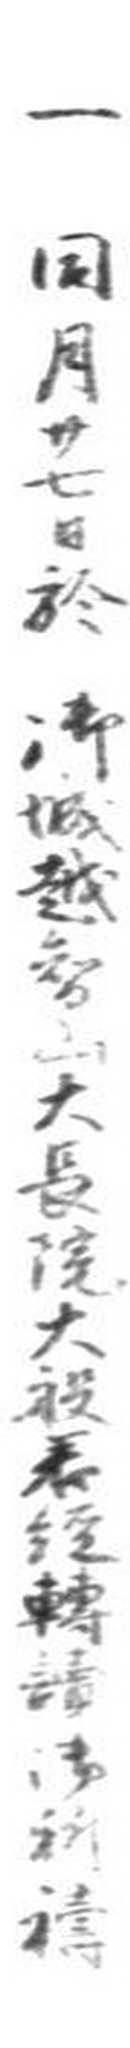一同月廿七日於御城越智山大長院大般若経転読御祈祷
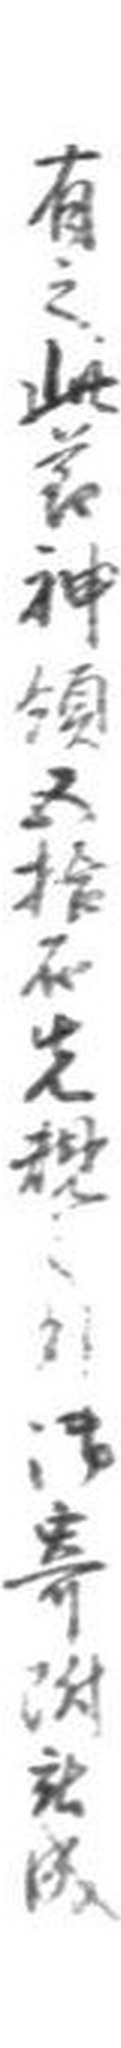有之此節神領五拾石先規之外御寄附被成

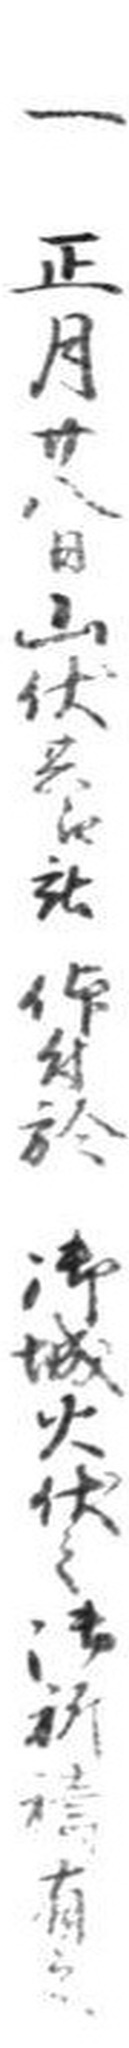一正月廿八日山伏共江被仰付於御城火伏之御祈祷有之
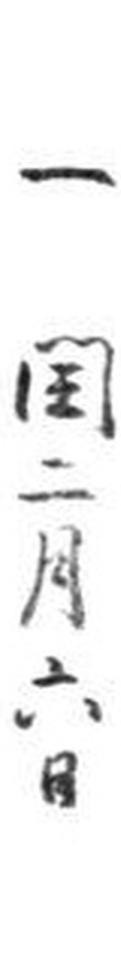一閏二月六日
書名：家譜 三 忠昌公 従慶長八年到寛永六年
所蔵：福井県文書館 Fukui Prefectural Archives
